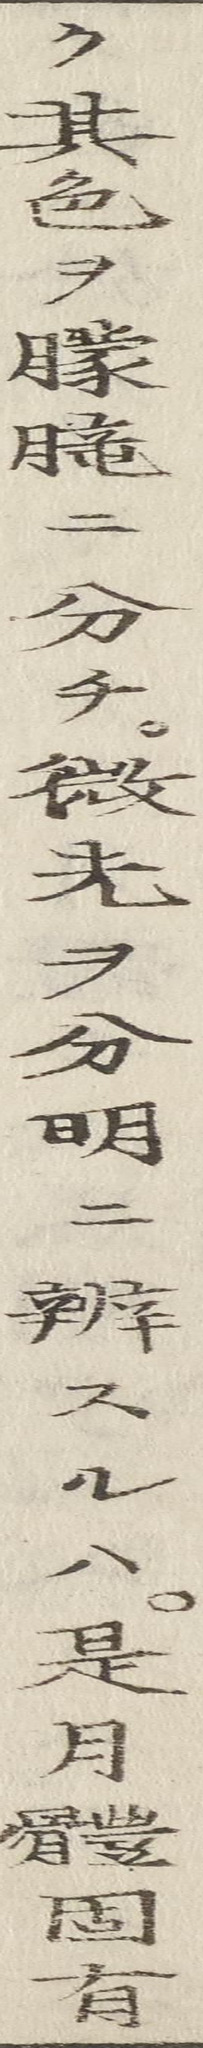ク其色ヲ朦朧ニ分チ。微光ヲ分明ニ弁スルハ。是月体固有
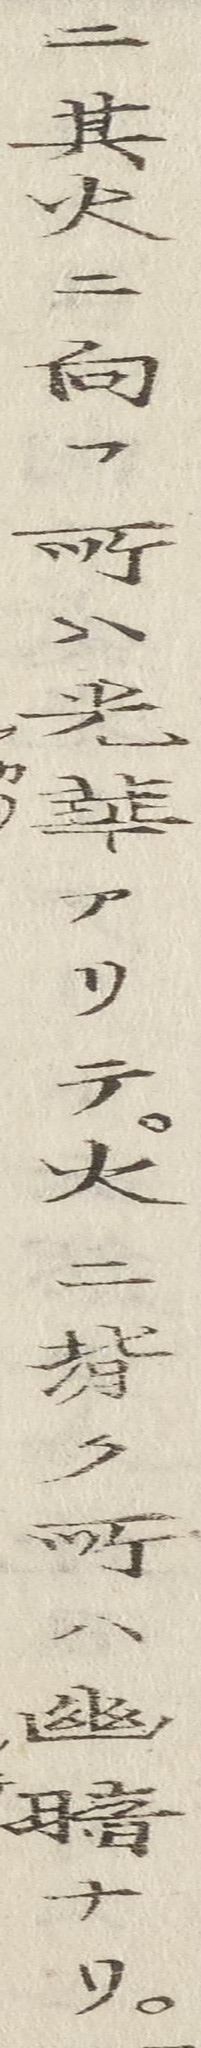ニ其火ニ向フ所ハ光華アリテ。火ニ背ク所ハ幽暗ナリ。是地
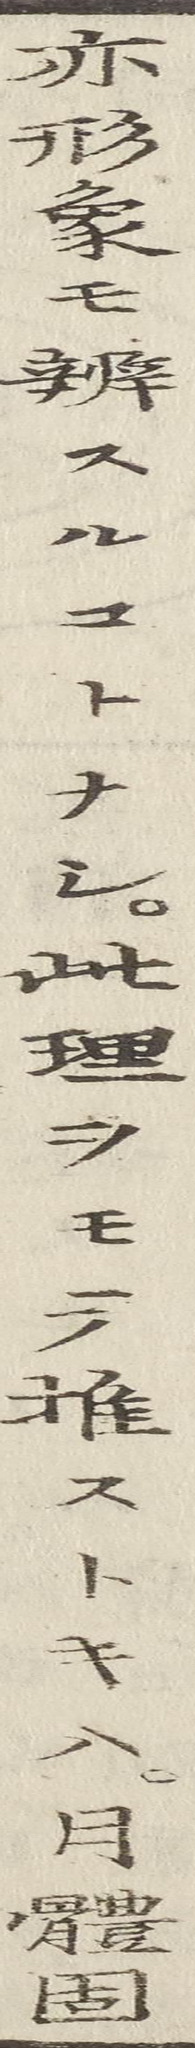亦形象モ弁スルコトナシ。此理ヲモテ推ストキハ。月体固
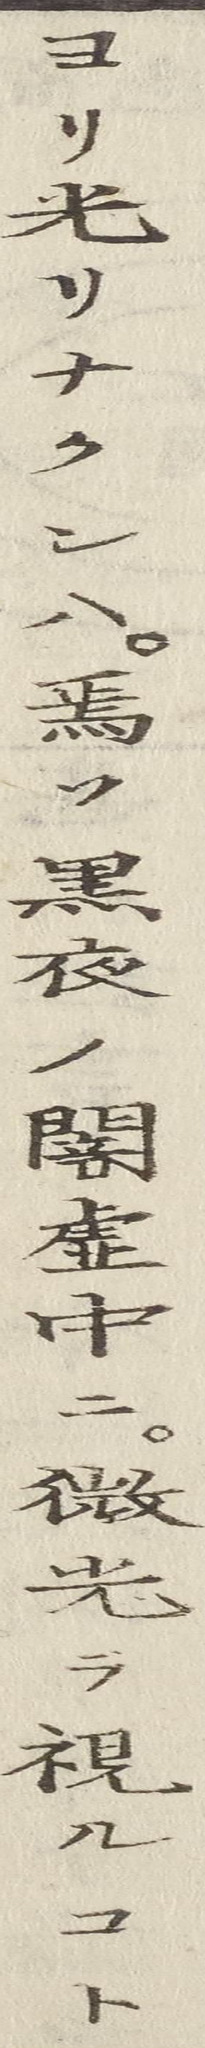ヨリ光リナクンハ。焉ソ黒夜ノ闇虚中ニ。微光ヲ視ルコト
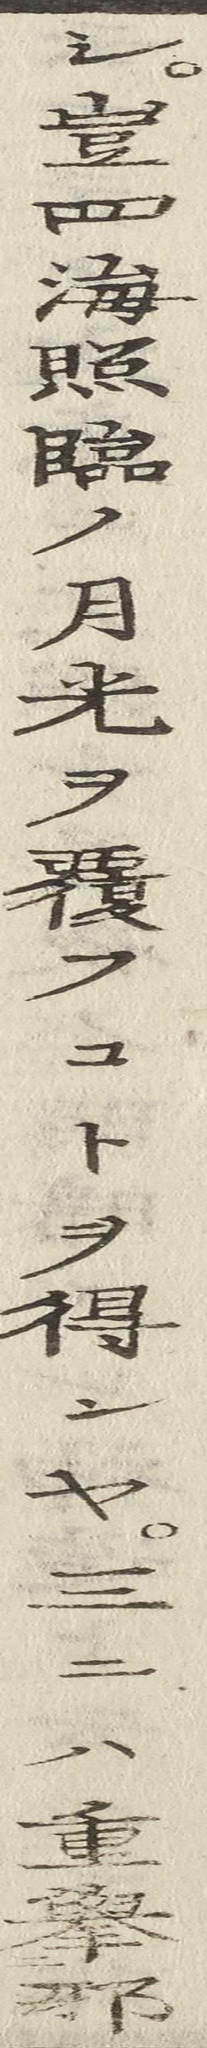シ。豈四海照臨ノ月光ヲ覆フコト得ンヤ。三ニハ重挙ニ邪
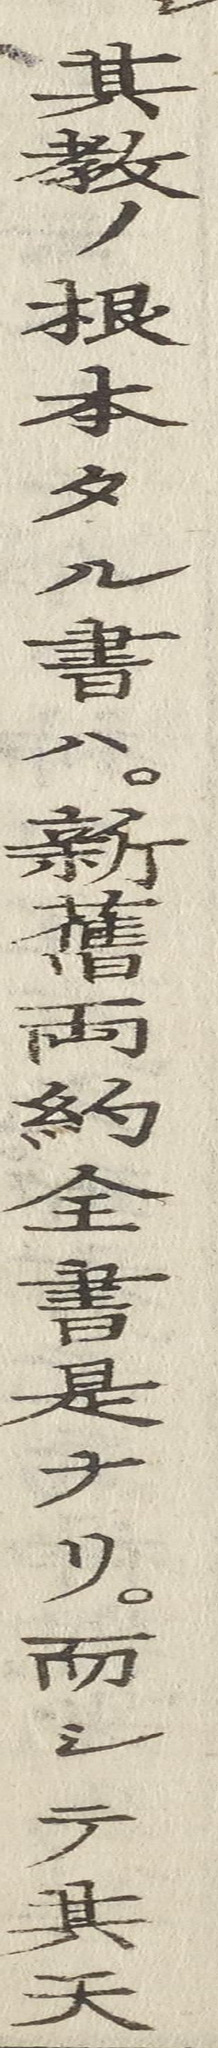シ其教ノ根本タル書ハ。新旧両約全書是ナリ。而シテ其天
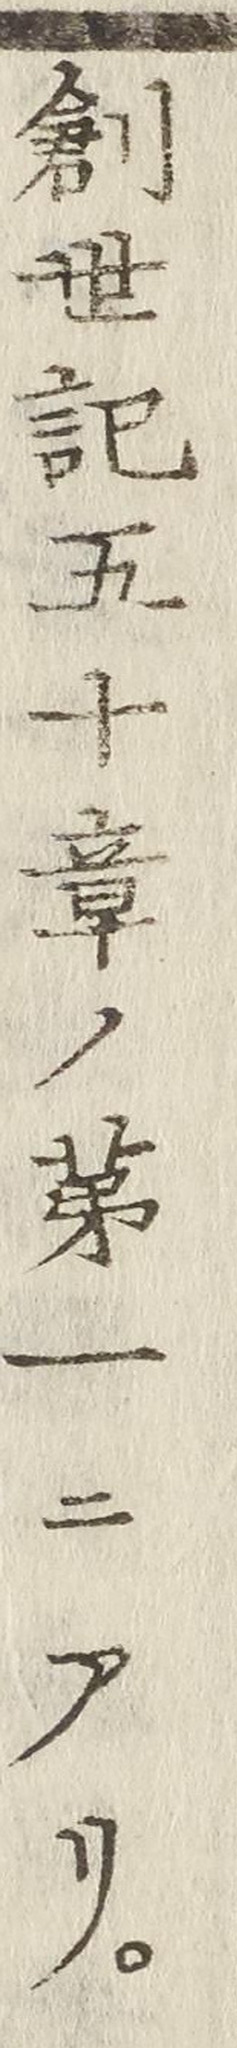創世記五十章ノ第一ニアリ。
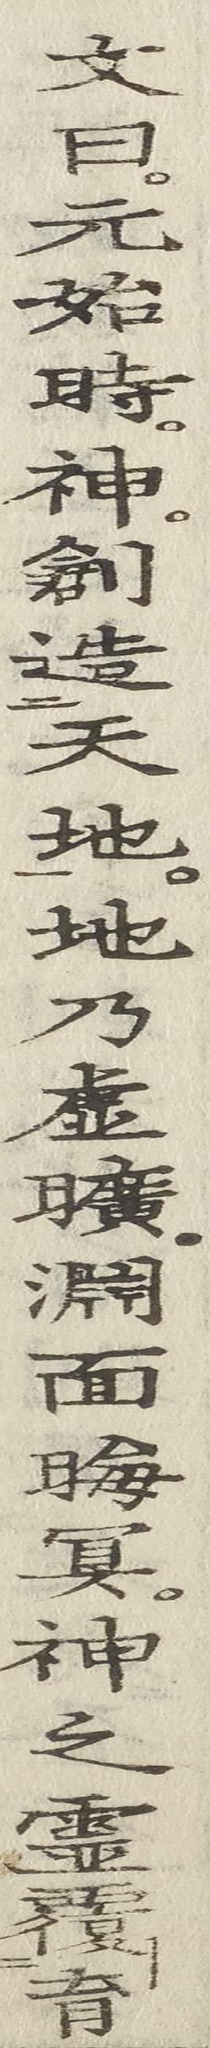文曰。元始時。神。創造ニ天地。地乃虚曠。淵面晦冥。神之霊覆ニ育

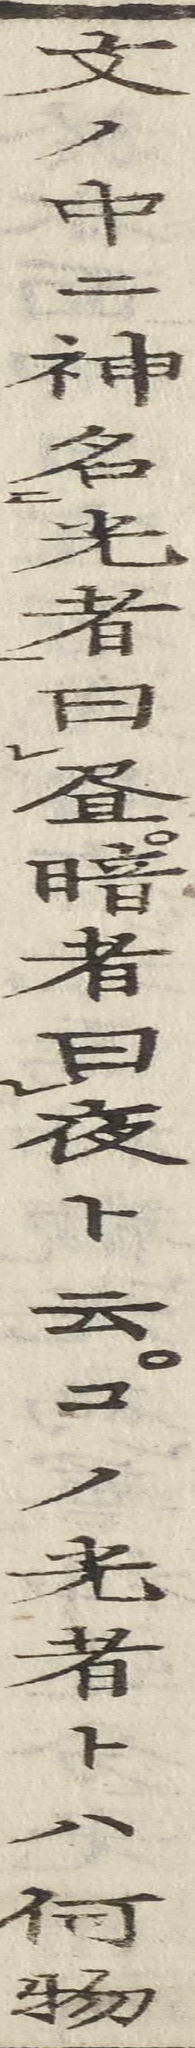文ノ中ニ神名ニ光者曰昼。暗者曰夜ト云。コノ光者トハ何物
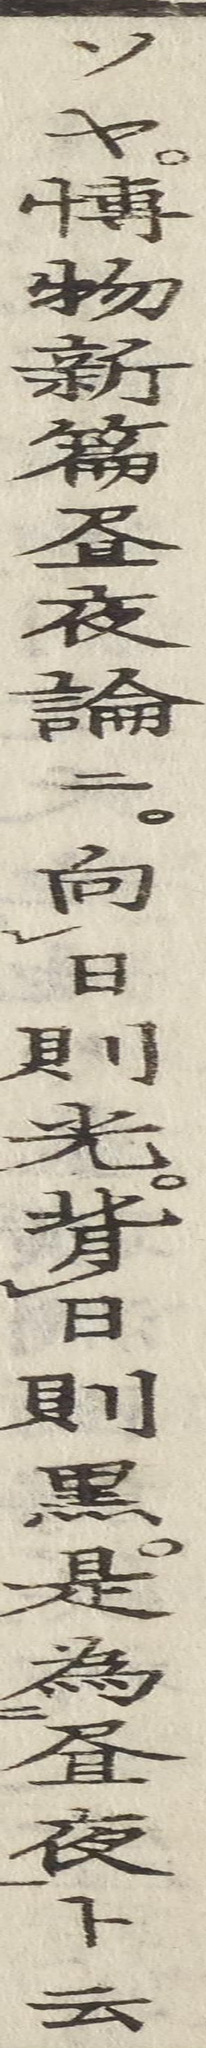ソヤ。博物新篇昼夜論ニ。向日則光。背日則黒。是為ニ昼夜ト云
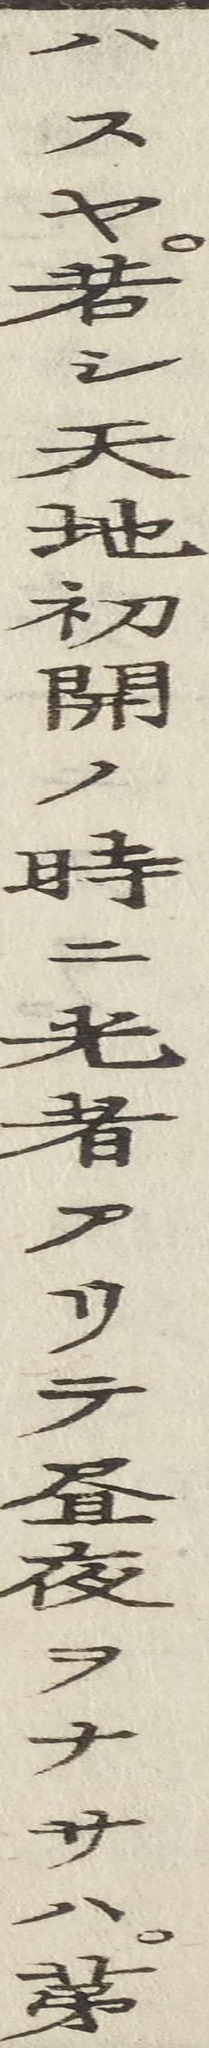ハスヤ。若シ天地初開ノ時ニ光者アリテ昼夜ヲナサハ。第
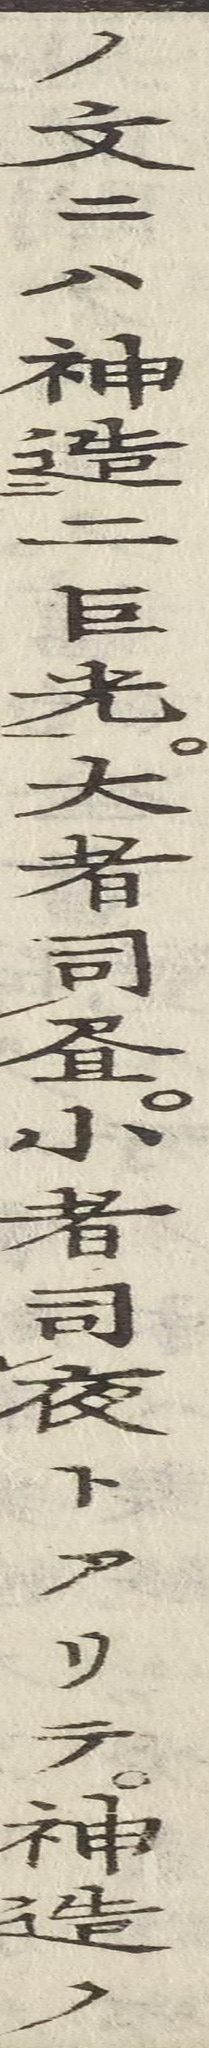ノ文ニハ神造ニニ巨光。大者司昼。。小者司夜トアリテ。神造ノ
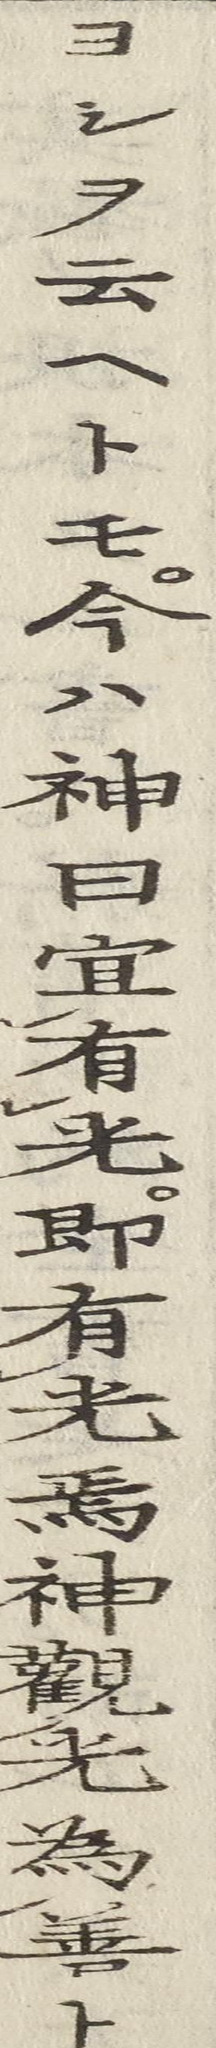ヨシヲ云ヘトモ。今ハ神曰宜有光。即有光焉神観光為善ト
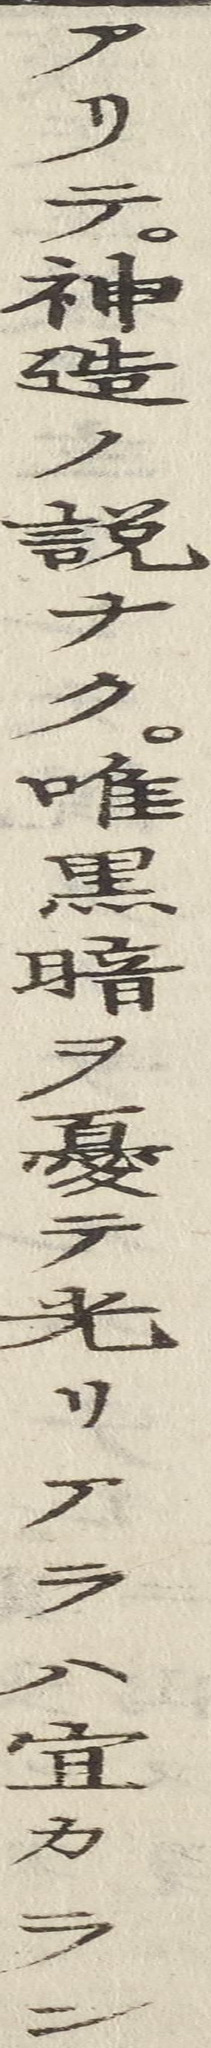アリテ。神造ノ説ナク。唯黒暗ヲ憂テ光リアラハ宜カラン
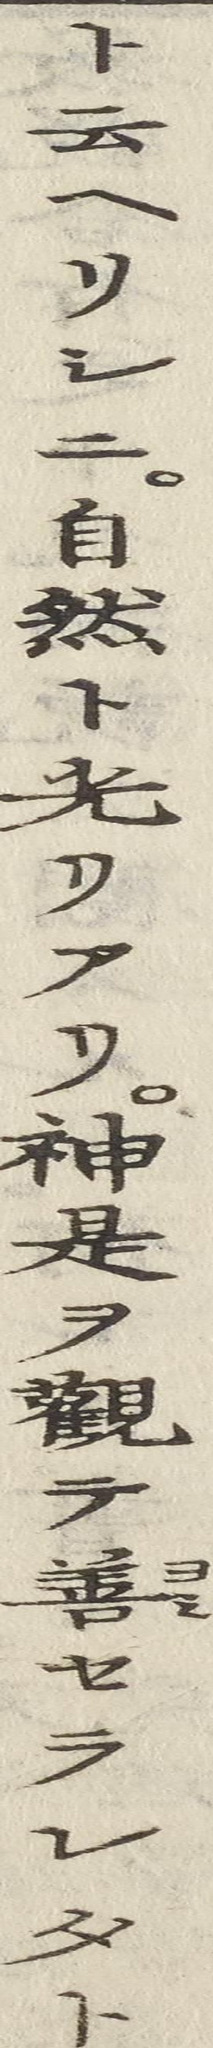ト云ヘリシニ。自然ト光リアリ。神是ヲ善セラレタト
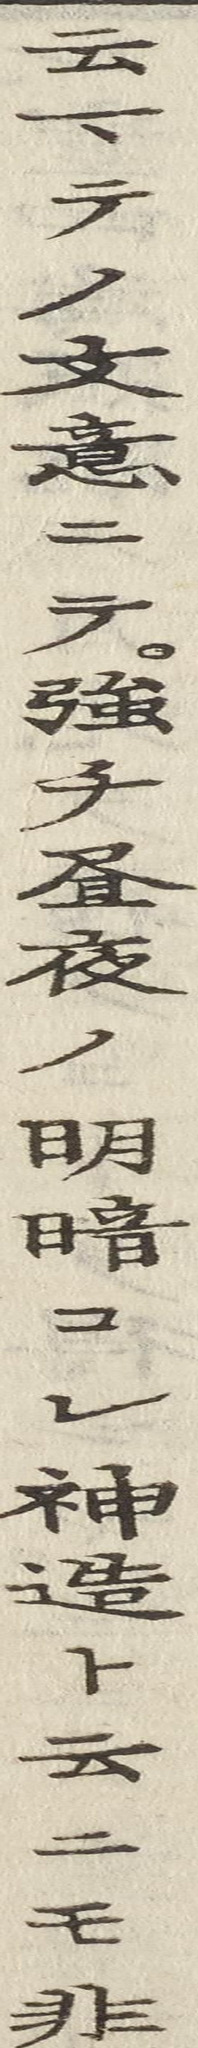云マテノ文意ニテ。強チ昼夜ノ明暗コレ神造ト云ニモ非
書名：護法新論　二編　下
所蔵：東京大学地震研究所図書室 Earthquake Research Institute Library, The University of Tokyo, JAPAN
